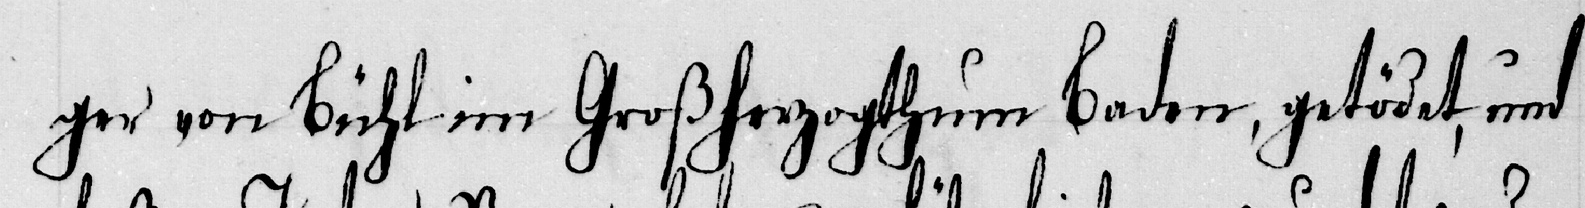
ger von Bühl im Großherzogthum Baden, getödet, und
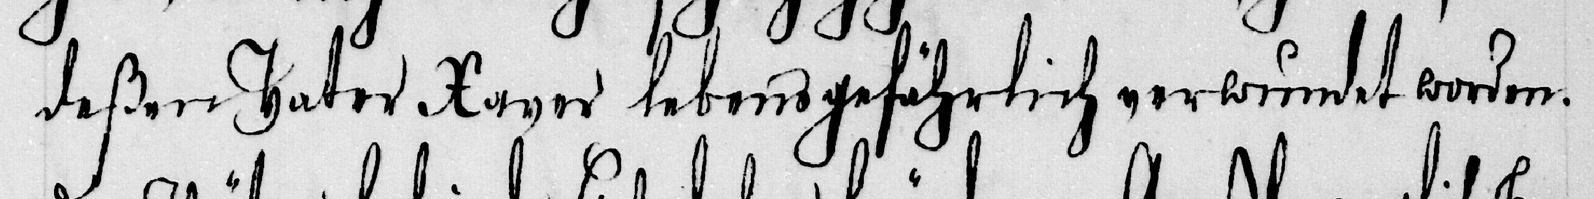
deßen Vater Xaver lebensgefährlich verwundet worden.
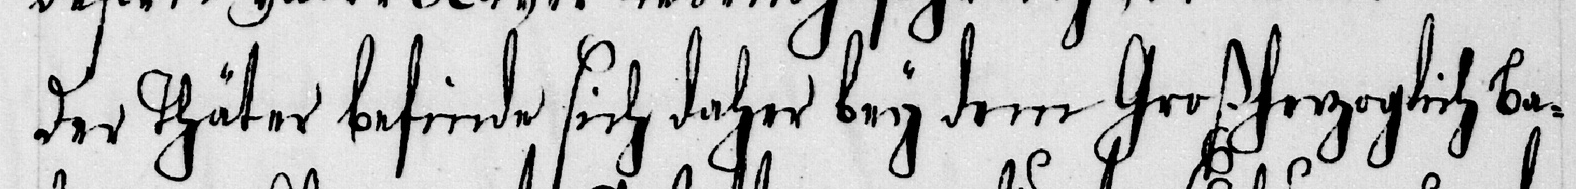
Der Thäter befinde sich daher bey dem Großherzoglich Ba¬
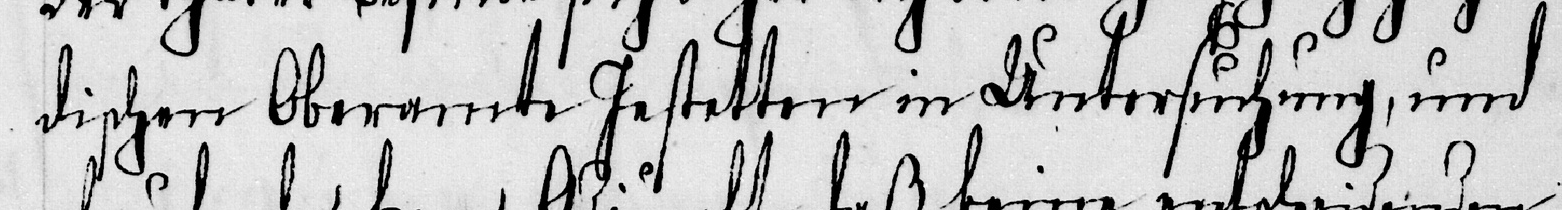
dischen Oberamte Jestetten in Untersuchung, und
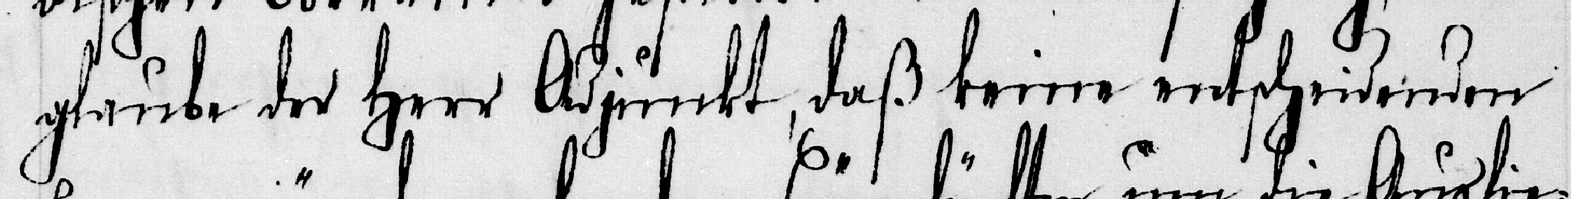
glaube der Herr Adjunkt, daß keine entscheidenden
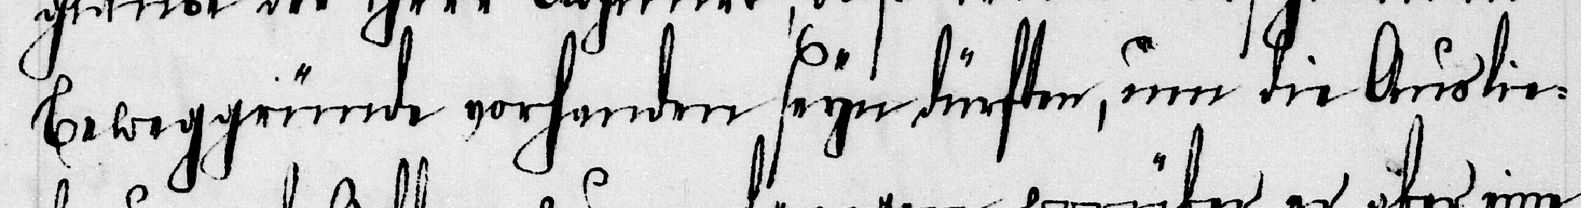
Beweggründe vorhanden seyn dürften, um die Auslie¬
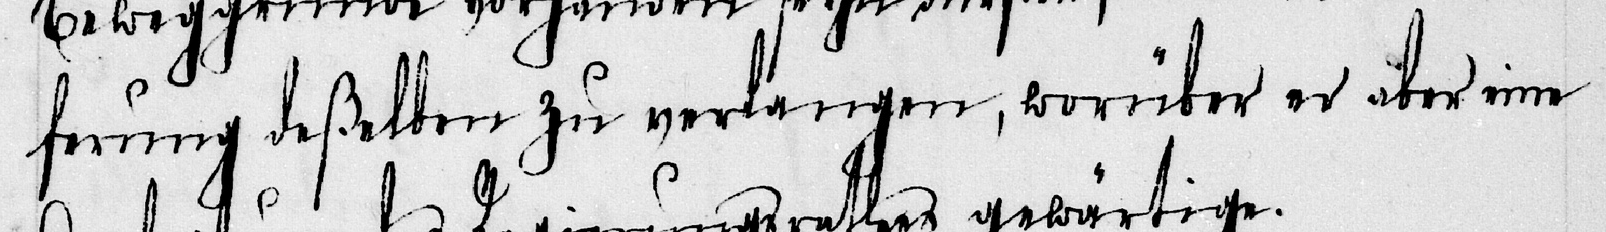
ferung deßelben zu verlangen, worüber er aber eine
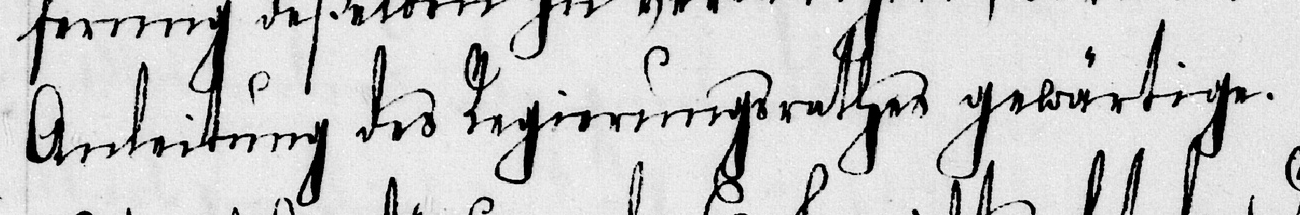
Anleitung des Regierungsrathes gewärtige.
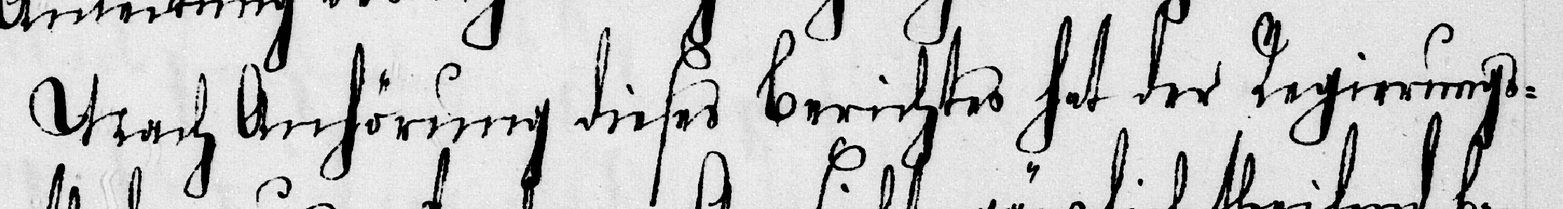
Nach Anhörung dieses Berichtes hat der Regierungsr¬
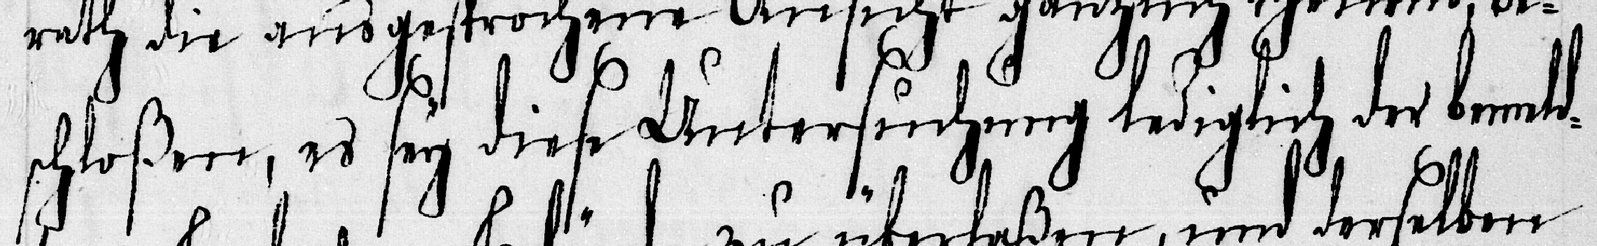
schloßen, es sey diese Untersuchung lediglich der bemeld¬
